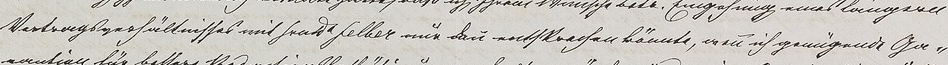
Vertragsverhältnisses mit Hrn DrFelber nur dann entsprechen könnte, wenn ich genügende Ga-
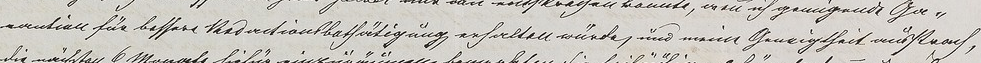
rantien für bessere Redactionsbethätigung erhalten würde, und meine Geneigtheit aussprach,
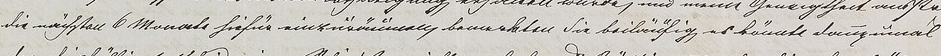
die nächsten 6 Monate hiefür einzuräumen, bemerkten Sie beiläufig, es könnte dannzumal
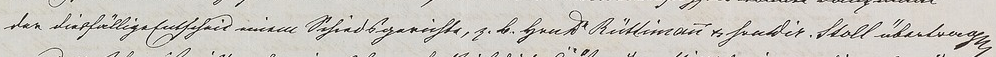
der diesfällige Entscheid einem Schiedsgerichte, z. B. Hrn DrRüttimann & Hrn Dir. Stoll übertragen
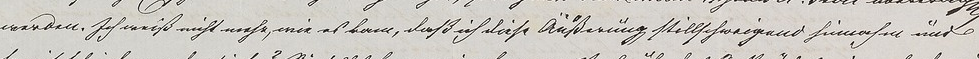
werden. Ich weiß nicht mehr, wie es kam, daß ich diese Äußerung stillschweigend hinnahm und
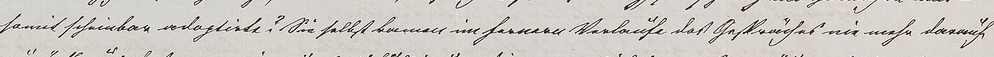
somit scheinbar adoptirte? Sie selbst kamen im fernern Verlaufe des Gespräches nie mehr darauf
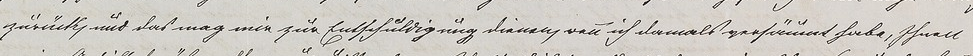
zurück, und das mag mir zur Entschuldigung dienen, wenn ich damals versäumt habe, Ihnen
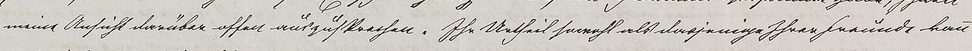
meine Ansicht darüber offen auszusprechen. Ihr Urtheil sowohl als dasjenige Ihrer Freunde kann
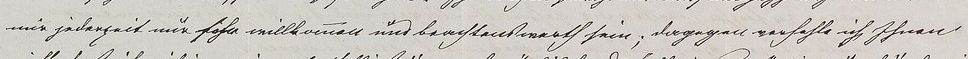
mir jederzeit nur sehr willkommen und beachtenswerth sein; dagegen verhehle ich Ihnen
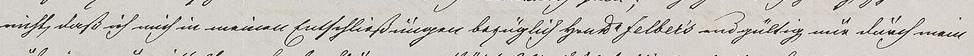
nicht, daß ich mich in meinen Entschließungen bezüglich Hrn DrFelber's endgültig nur durch mein
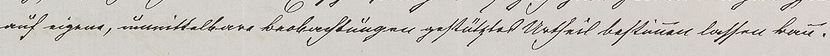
auf eigene, unmittelbare Beobachtungen gestütztes Urtheil bestimmen lassen kann.
